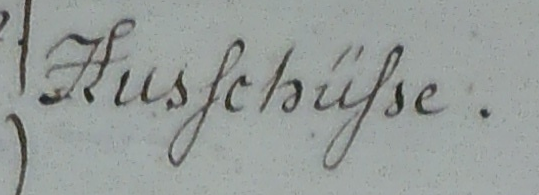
Ausschüsse.
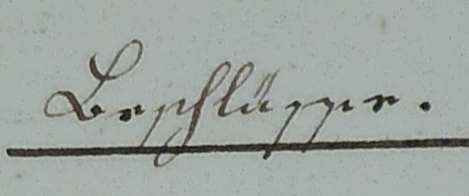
Beschlüsse.
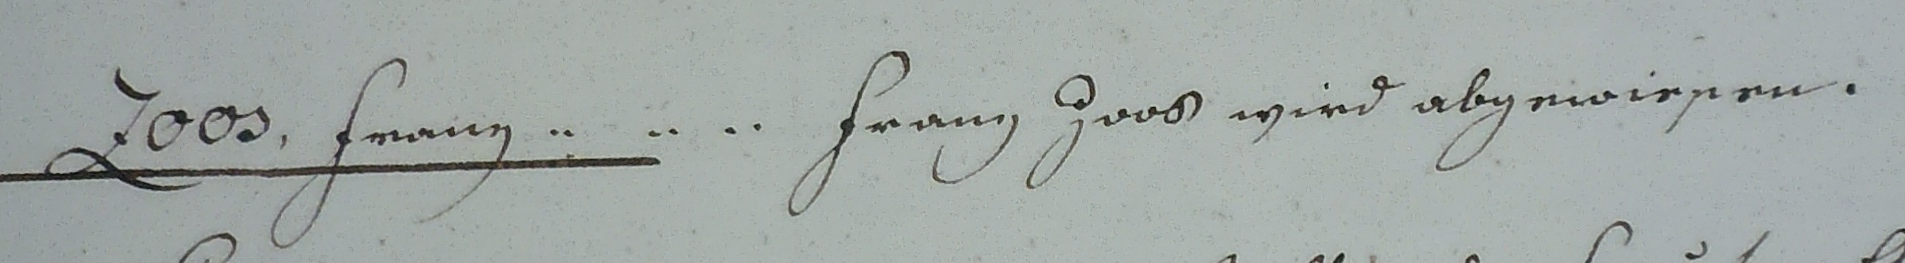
Zoos, Franz .. .. .. Franz Zoos wird abgewiesen.
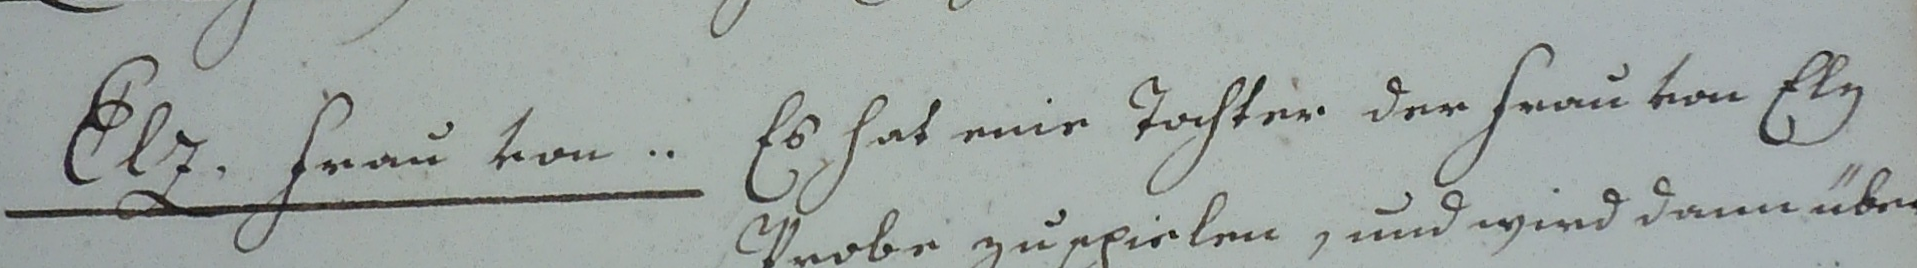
Elz, Frau von .. Es hat eine Tochter der Frau von ELz
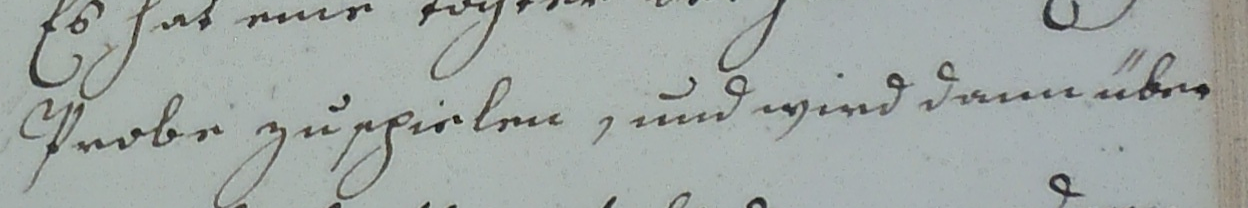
Probe zuspielen, und wird dann über
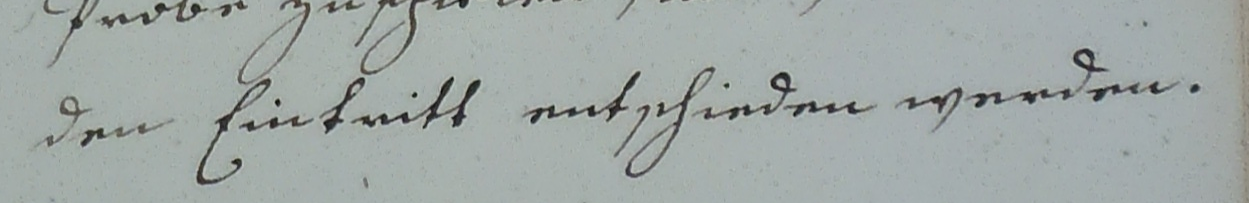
den Eintritt entschieden werden.
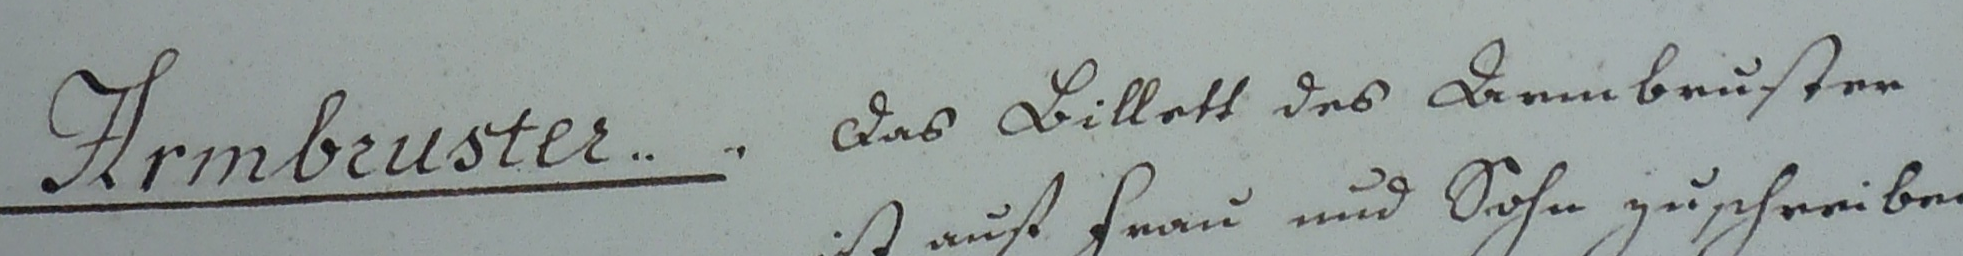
Armbruster .. .. Das Billett des Armbruster
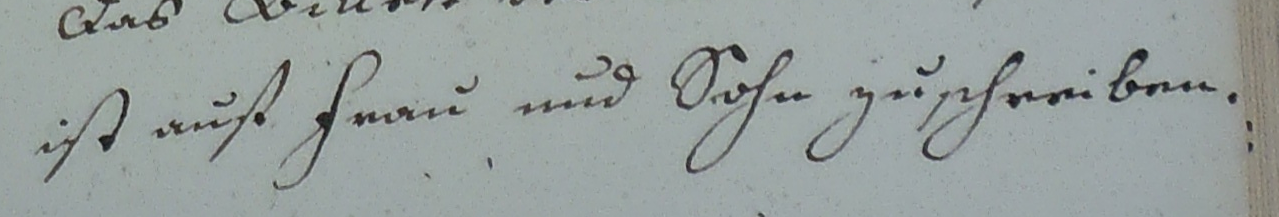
ist auf Frau und Sohn zuschreiben.
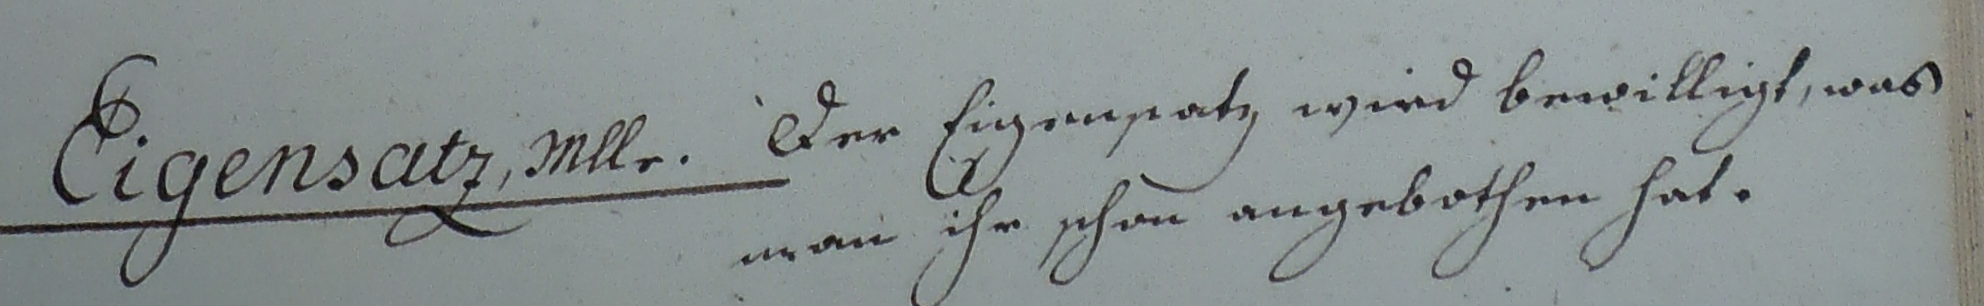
Eigensatz, Mlle. Der Eigensatz wird bewilligt, was
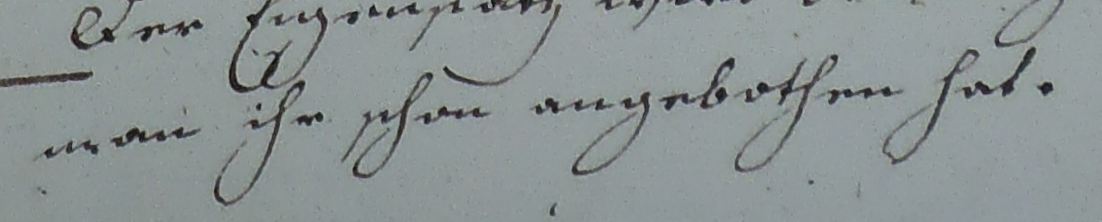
man ihr schon angebothen hat.
